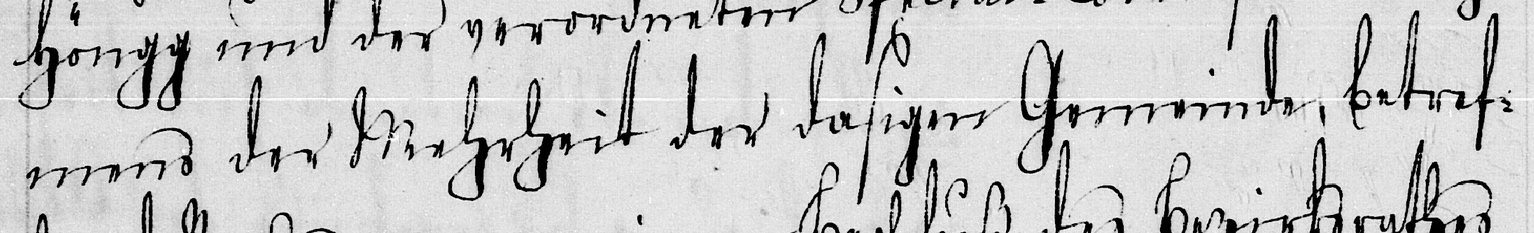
mens der Mehrheit der dasigen Gemeinde, betref¬
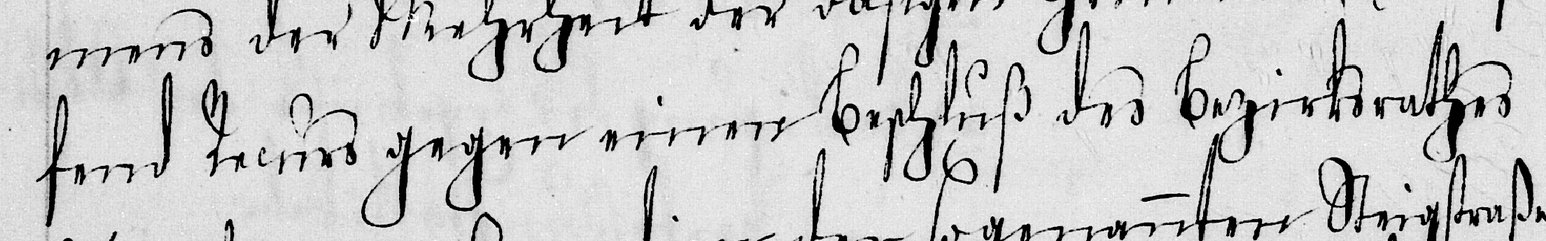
fend Recurs gegen einen Beschluß des Bezirksrathes
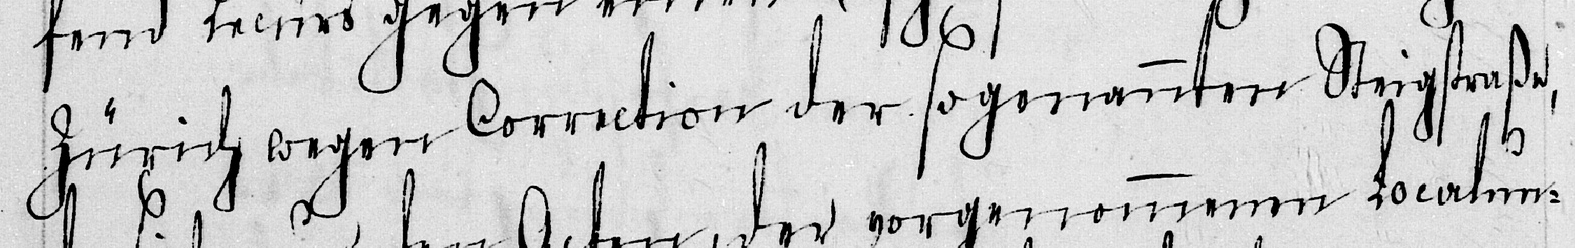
Zürich wegen Correction der sogenannten Steigstraße,
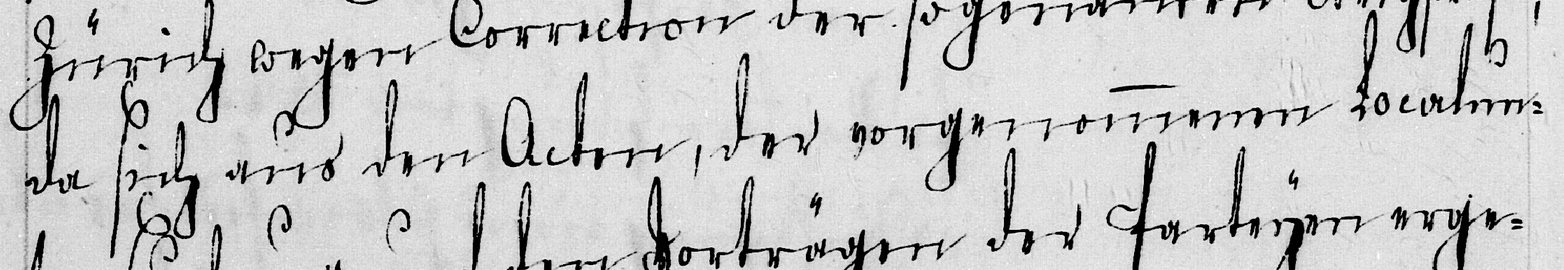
da sich aus den Acten, der vorgenommenen Localun¬
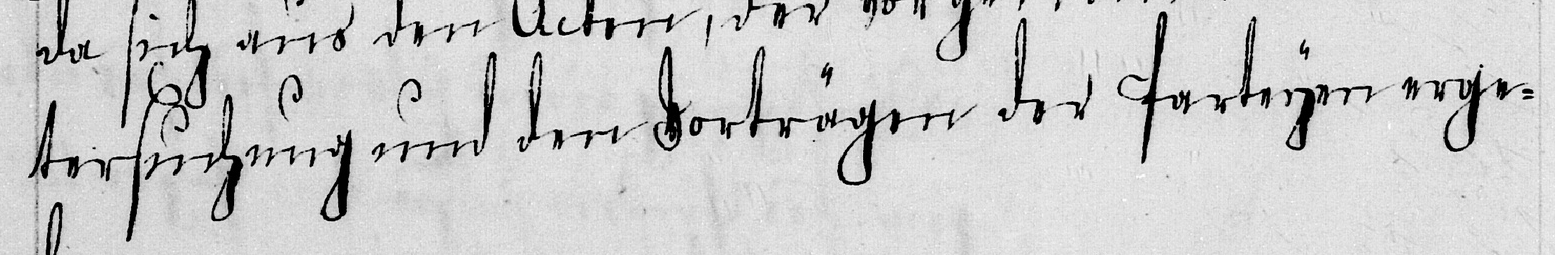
tersuchung und den Vorträgen der Parteyen erge¬
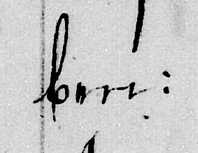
ben:
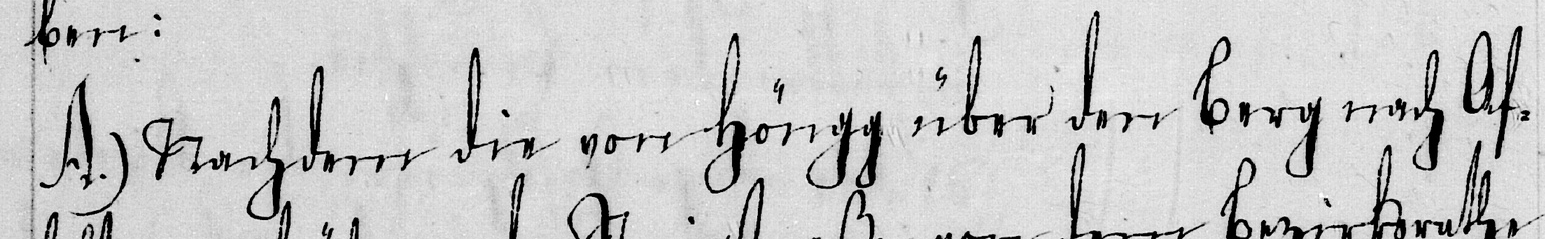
A.) Nachdem die von Höngg über den Berg nach Af¬
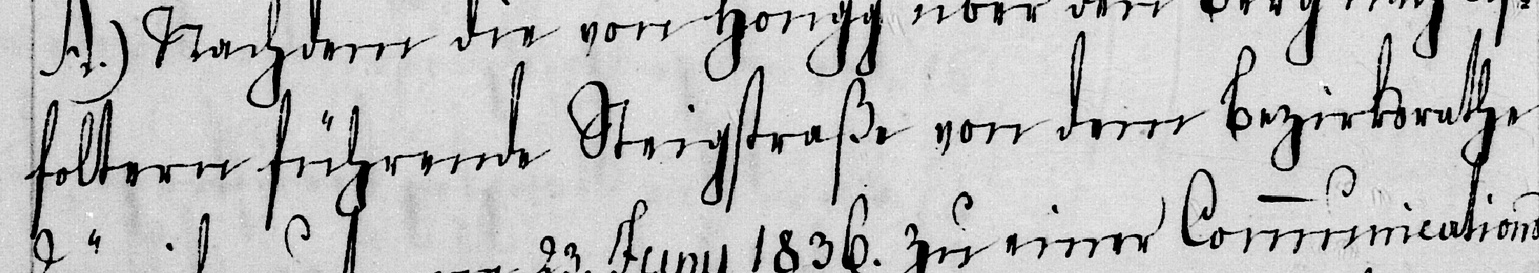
foltern führende Steigstraße von dem Bezirksrathe
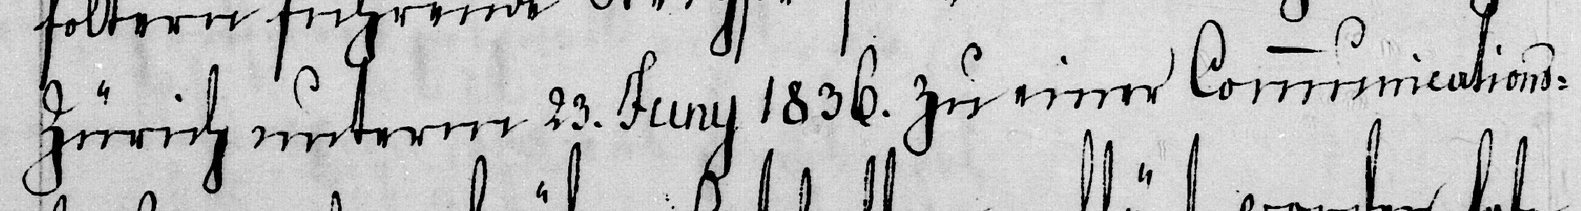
Zürich unterm 23. Juny 1836. zu einer Communications¬
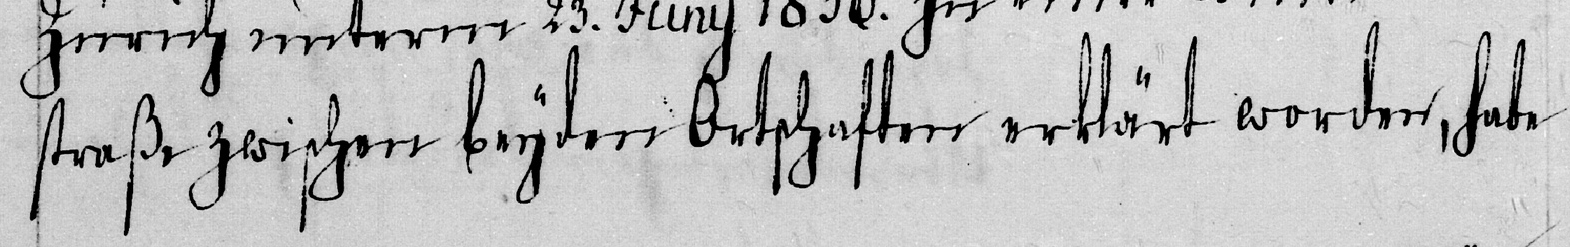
straße zwischen beyden Ortschaften erklärt worden, habe
